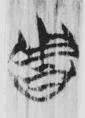周
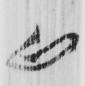㠯（以）
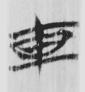車
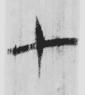七
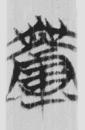{亠舛車}
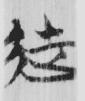徒
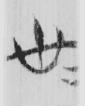丗=
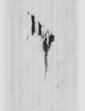人
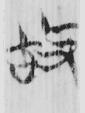故
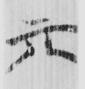亓
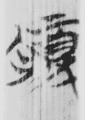腹
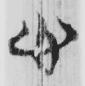心
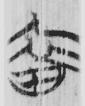{衣田}
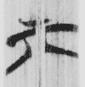亓
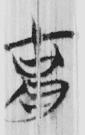{肉古}
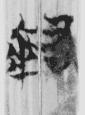{手厷}
